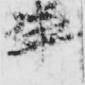東
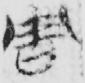周
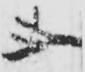之
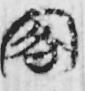客
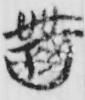○（許）
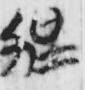○（盈）
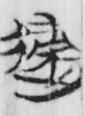歸
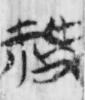祚（胙）
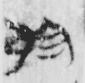於
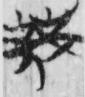栽
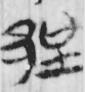郢
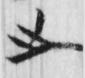之
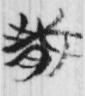歲（歲）
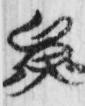○（爨）
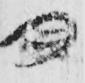月
